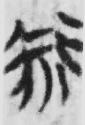行
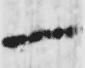一
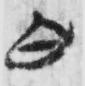白
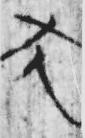犬
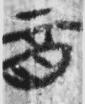酉（酒）
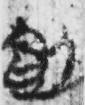○（食）
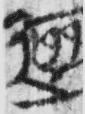迻
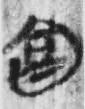會
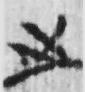之
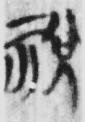敓
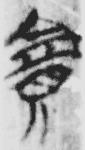賽
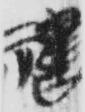禱
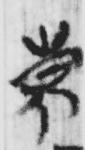東
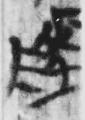陵
